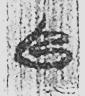𠂤
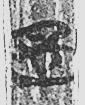是
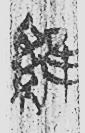雞
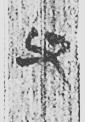父
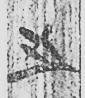之
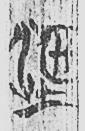{水𦣞土}
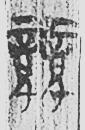競
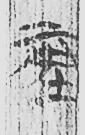坪
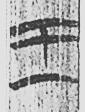王
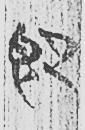即
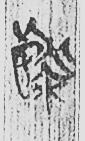殜
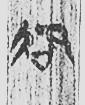卲
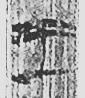王
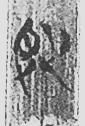即
